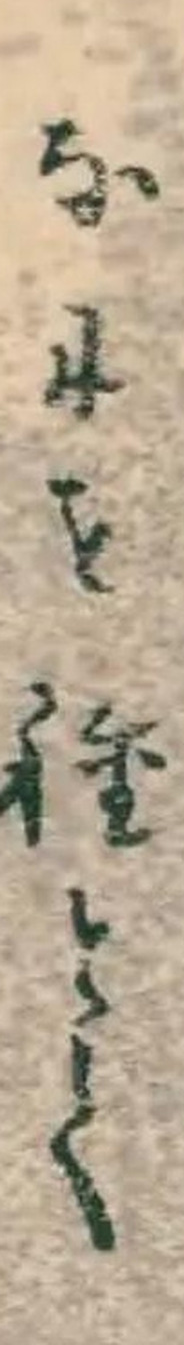なにを種とて
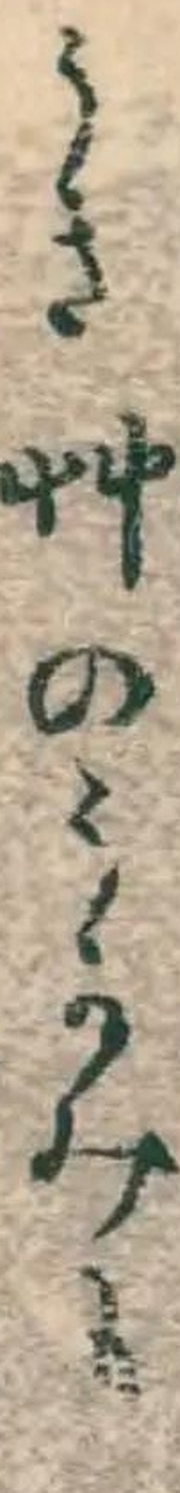うき艸のうかみも
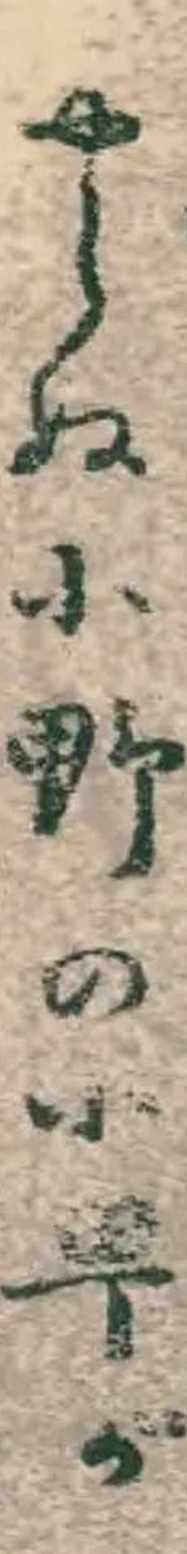やらぬ小野の小町が
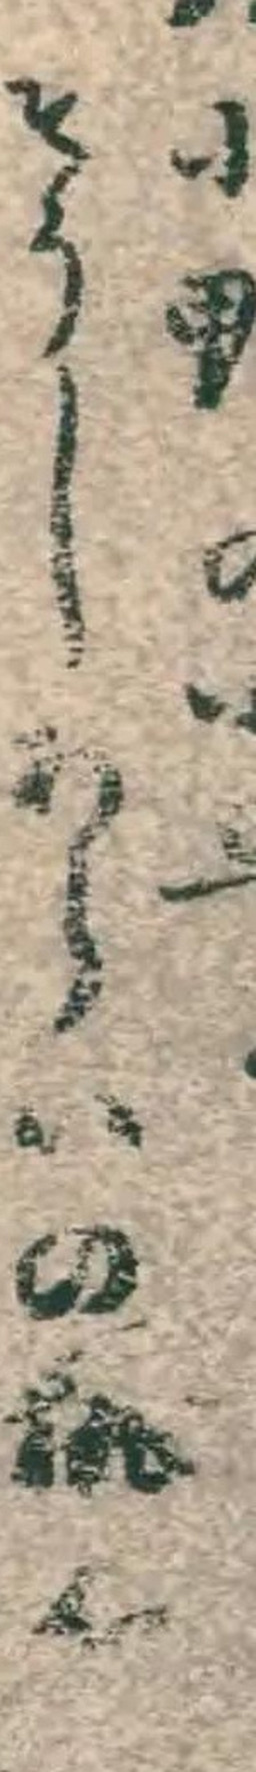そうしあらいの執心
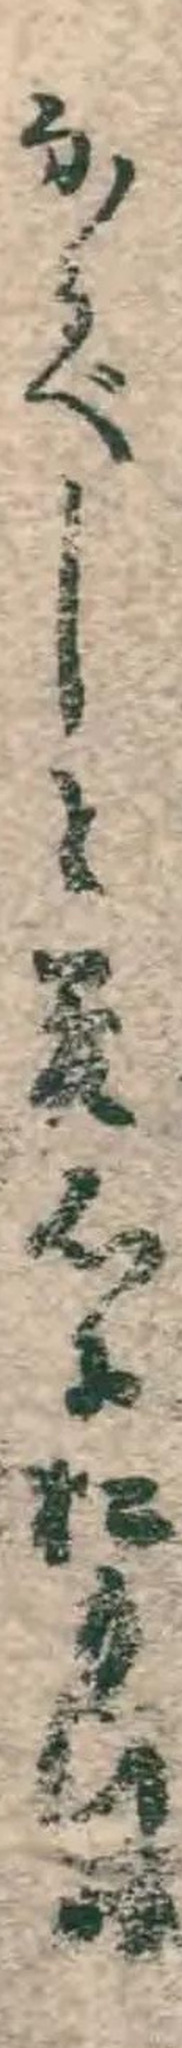なるべしと夢心におもひぬ
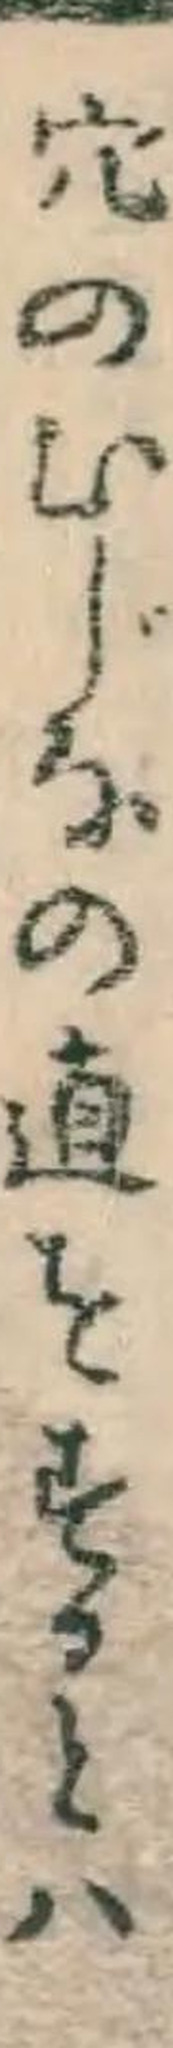穴のむじなの直をするとは
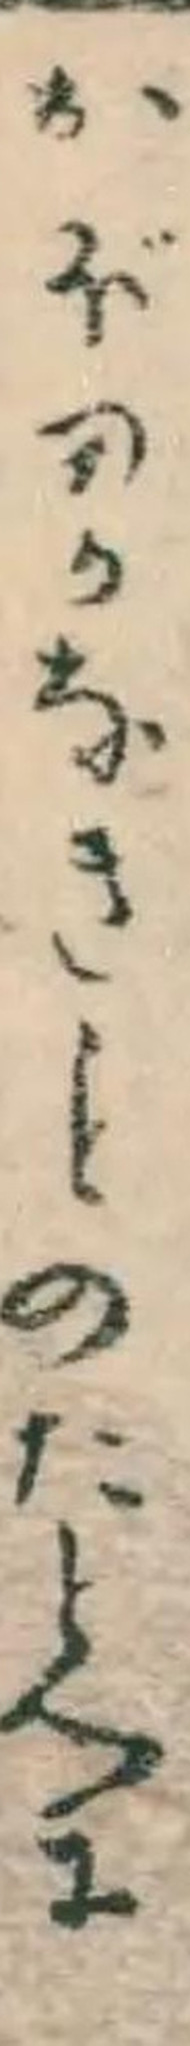おぼつかなきことのたとへに
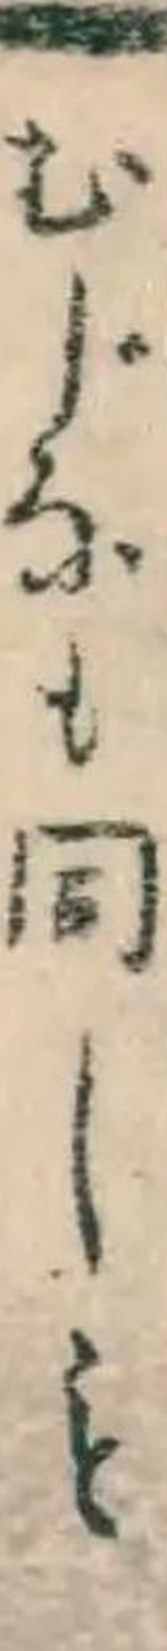むじなも同しこと
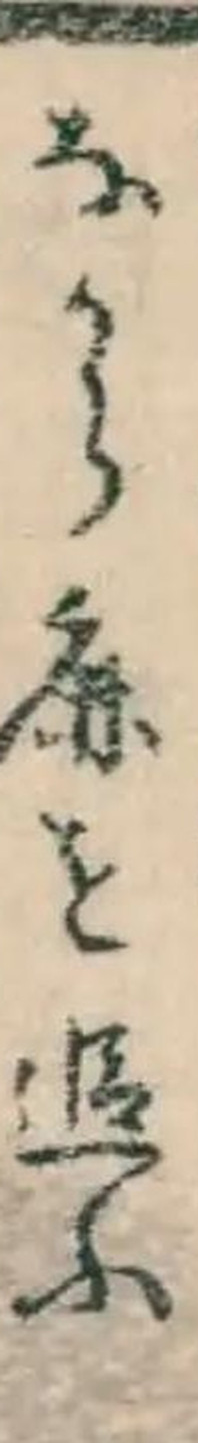なから鹿を追ふ
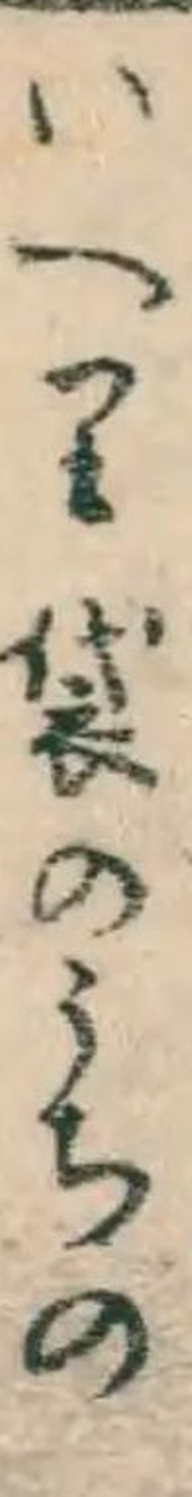いへり袋のうちの
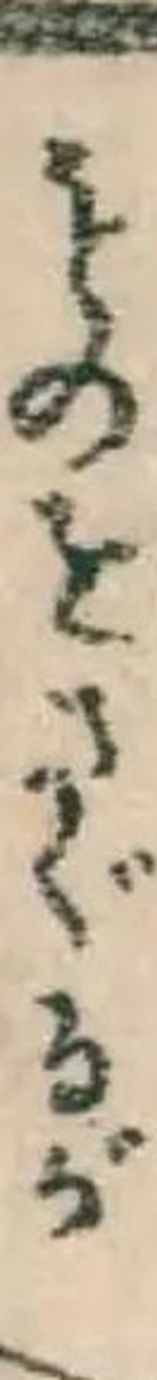ものをさぐるが
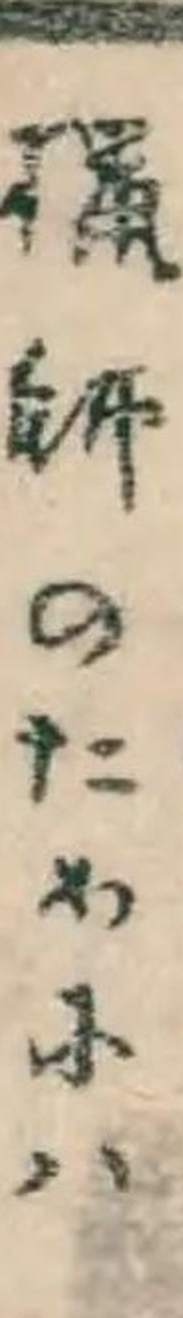猟師のためには
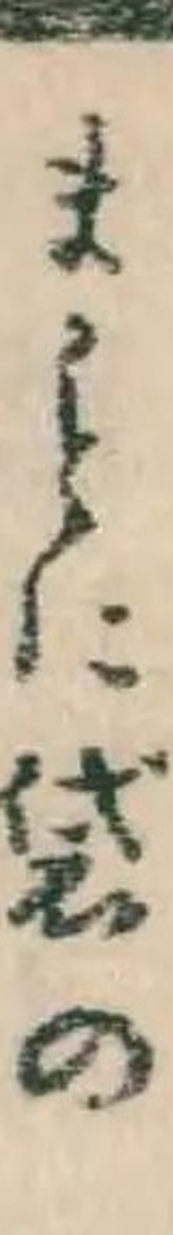まことに袋の
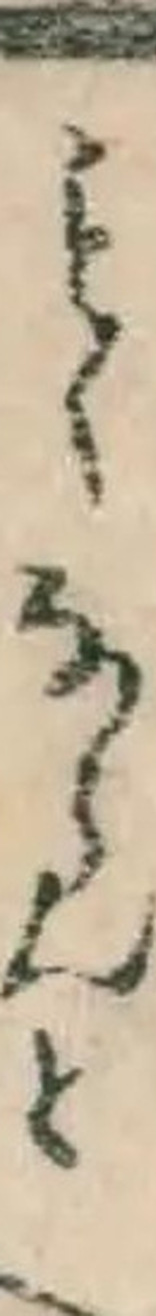ことくならんと
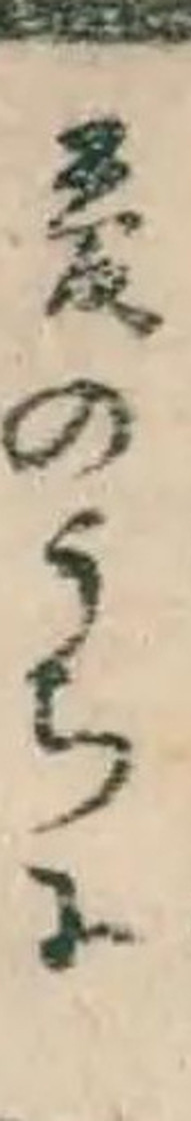夢のうちに
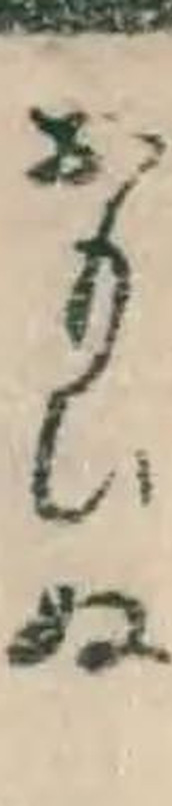おもひぬ
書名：百鬼徒然袋 3巻. [2]
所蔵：国立国会図書館 National Diet Library, JAPAN
